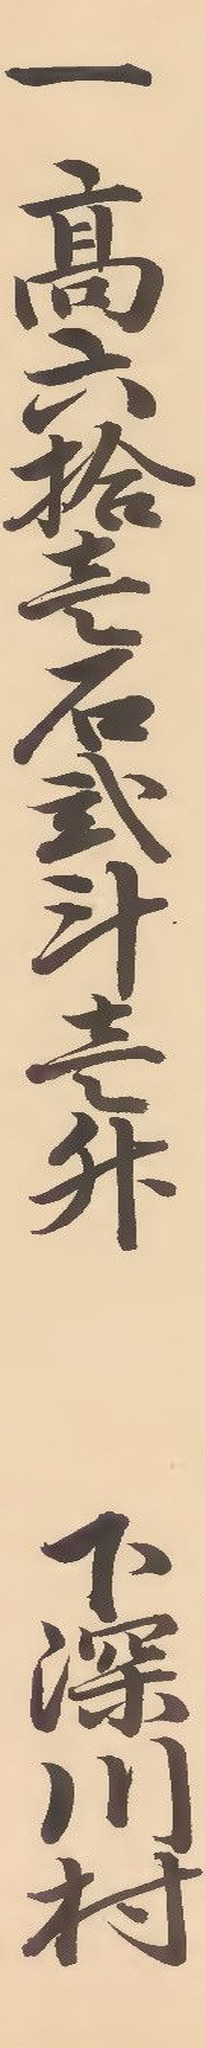一高六拾壱石弐斗壱升下深川村
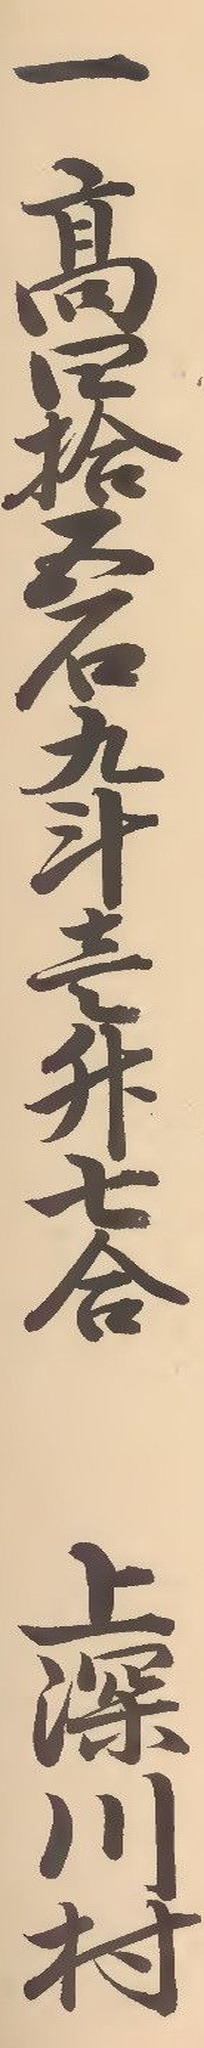一高四拾五石九斗壱升七合上深川村
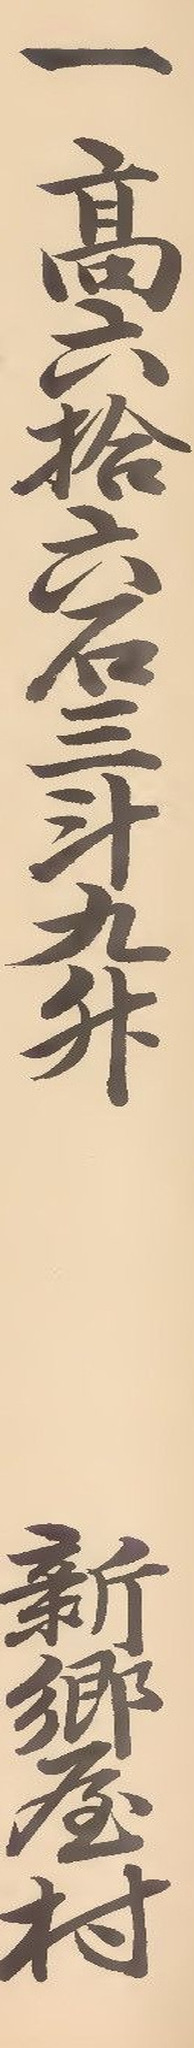一高六拾六石三斗九升新郷屋村
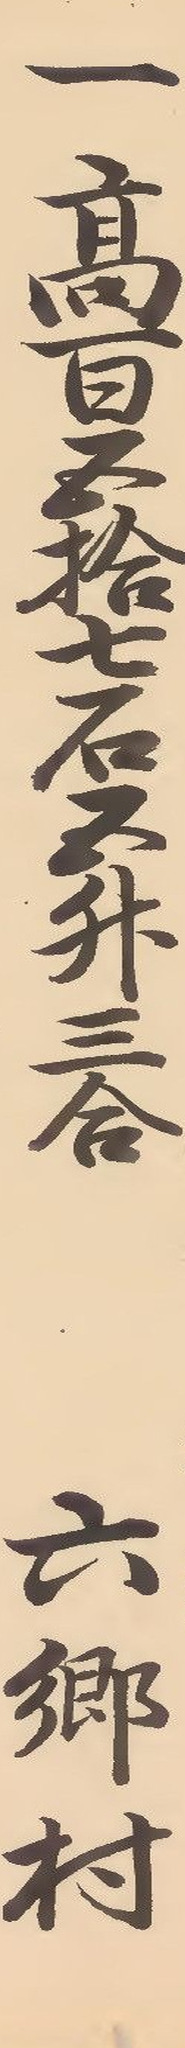一高百五拾七石五升三合六郷村
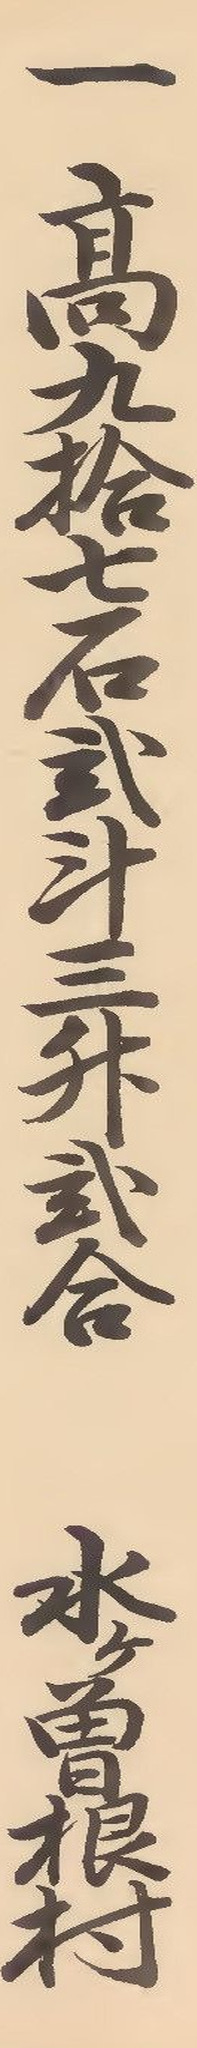一高九拾七石弐斗三升弐合水ヶ曽根村
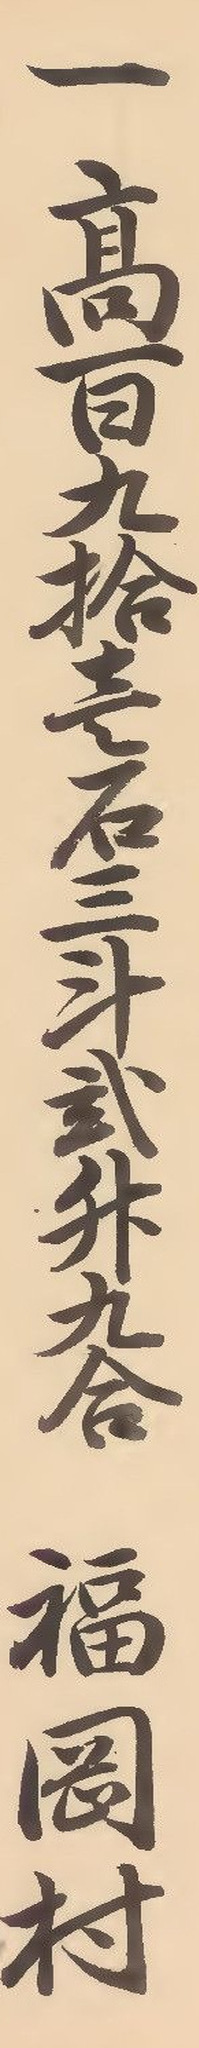一高百九拾壱石三斗弐升九合福岡村

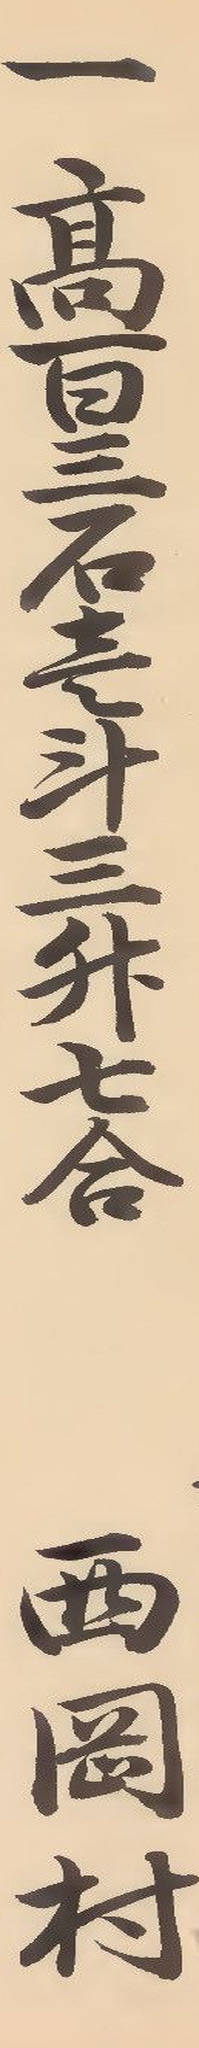一高百三石壱斗三升七合西岡村
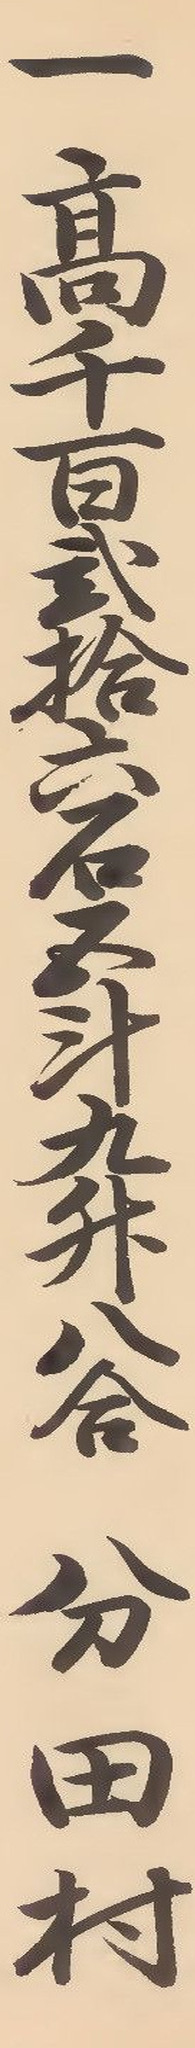一高千百弐拾六石五斗九升八合分田村
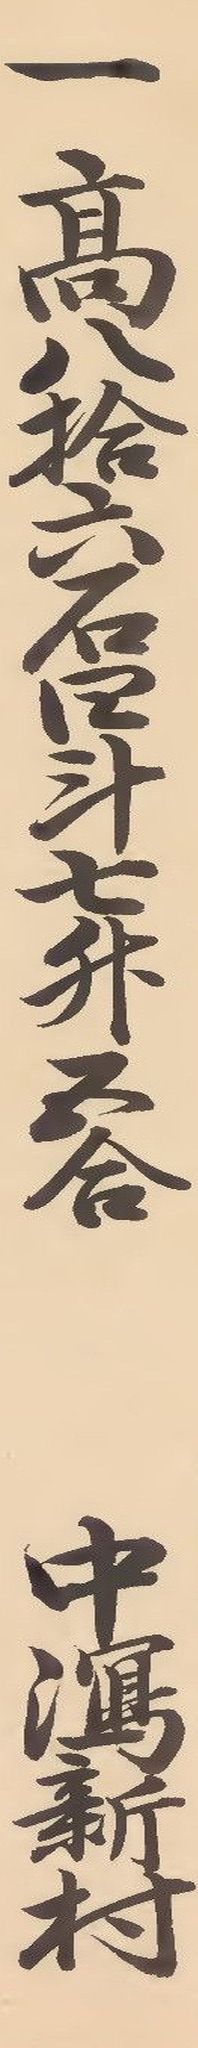一高八拾六石四斗七升五合中潟新村
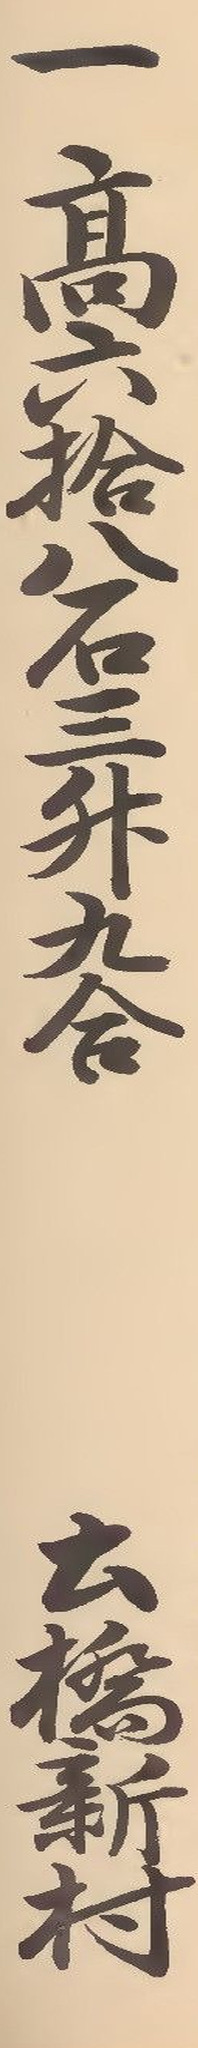一高六拾八石三升九合土橋新村
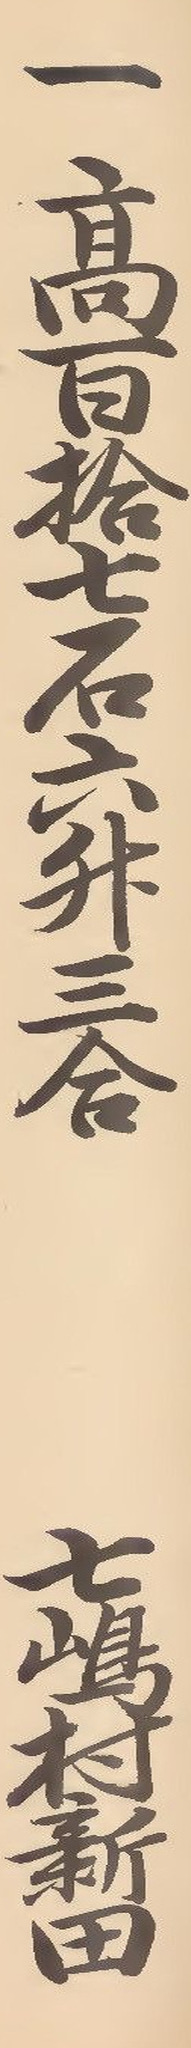一高百拾七石六升三合七島村新田
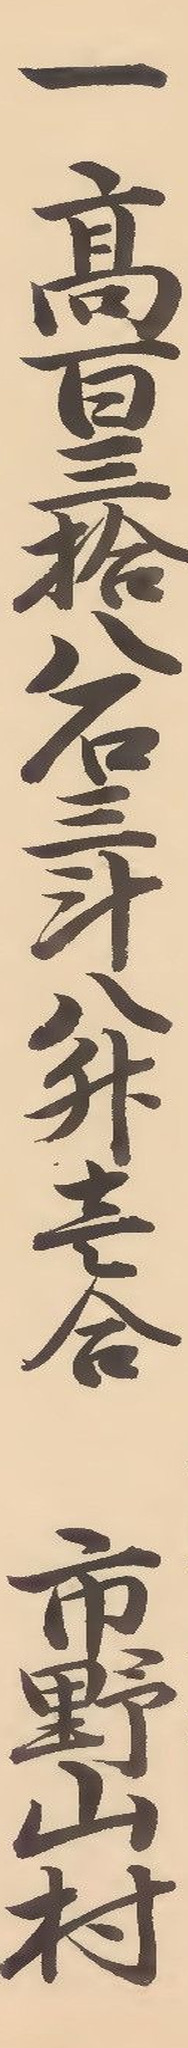一高百三拾八石三斗八升壱合市野山村
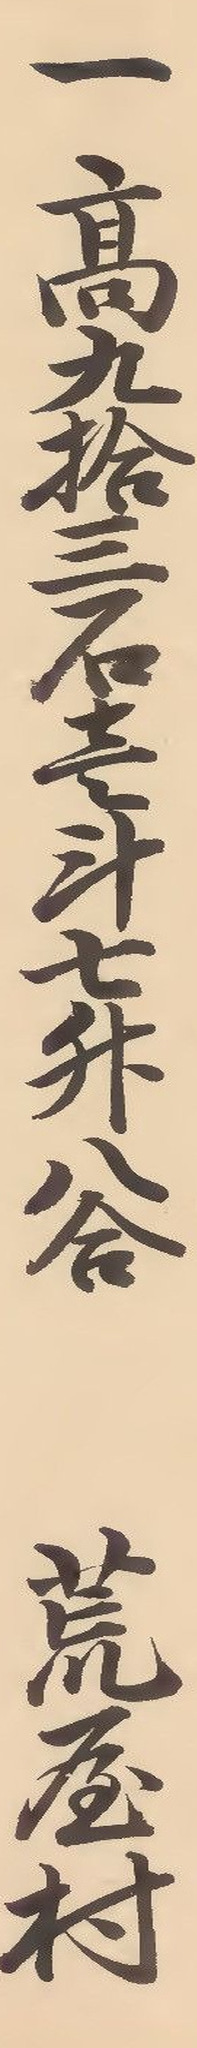一高九拾三石壱斗七升八合荒屋村

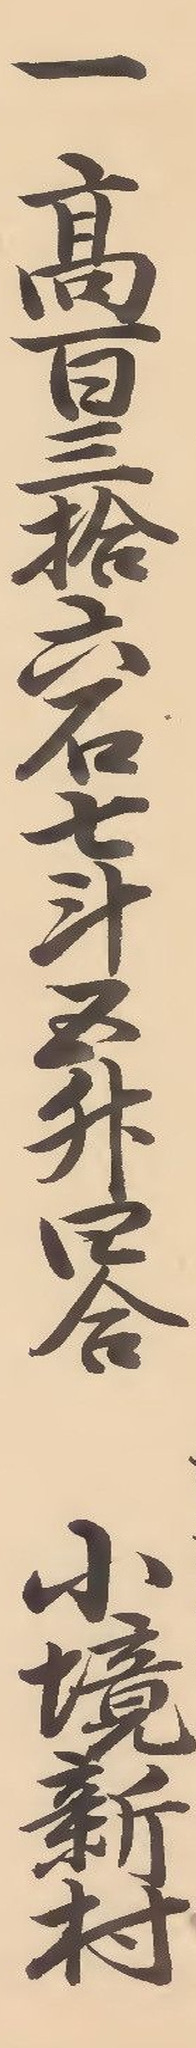一高百三拾六石七斗五升四合小境新村
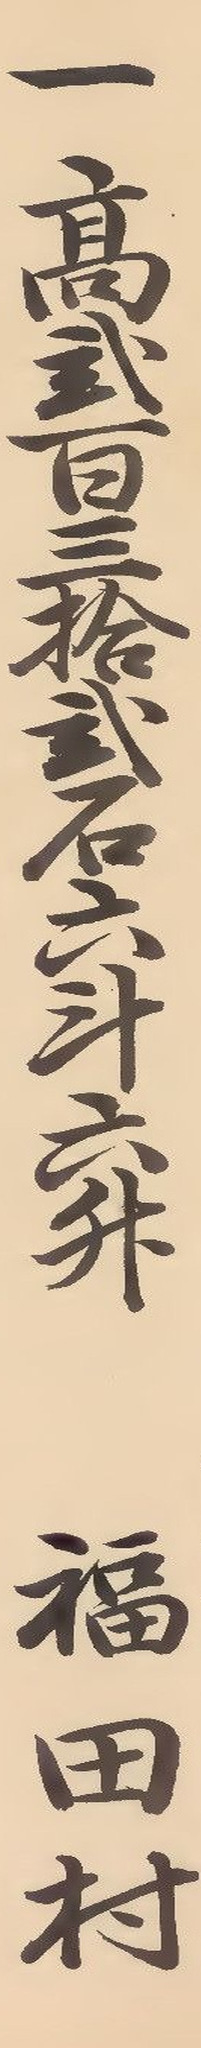一高弐百三拾弐石六斗六升福田村
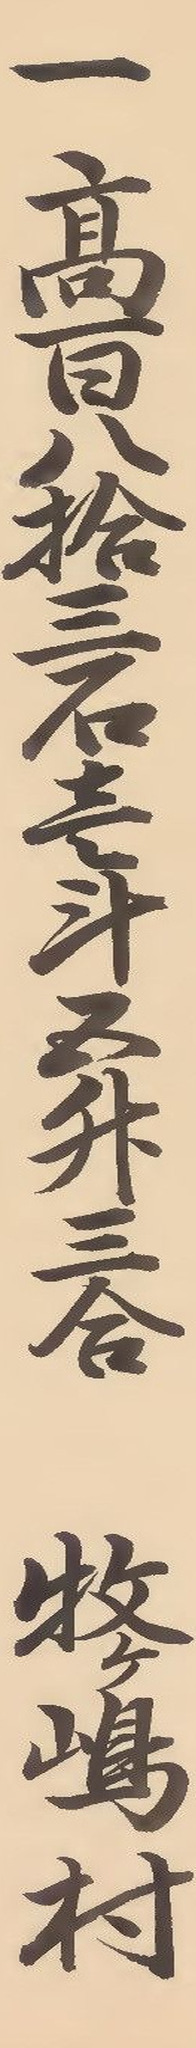一高百八拾三石壱斗五升三合牧ヶ島村
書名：越後国郷帳　下
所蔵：国立公文書館 National Archives of Japan
